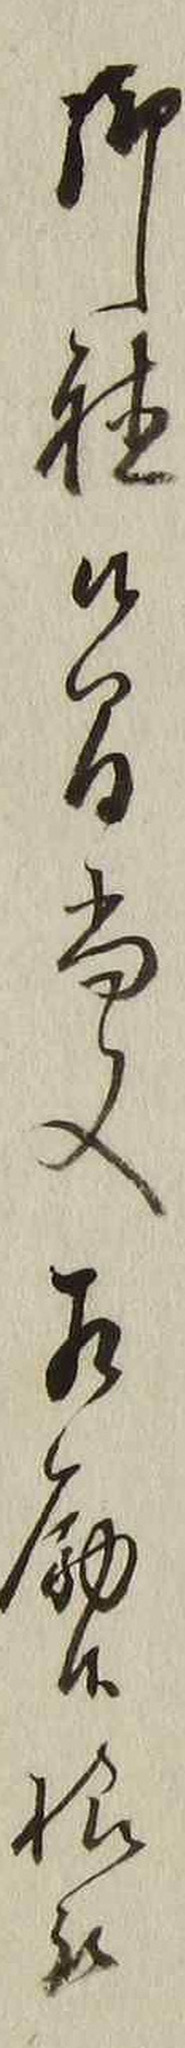御聴候間尚又相励候様被
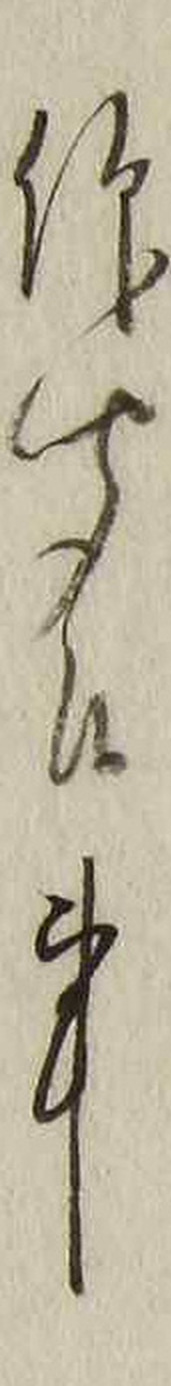仰聞候事
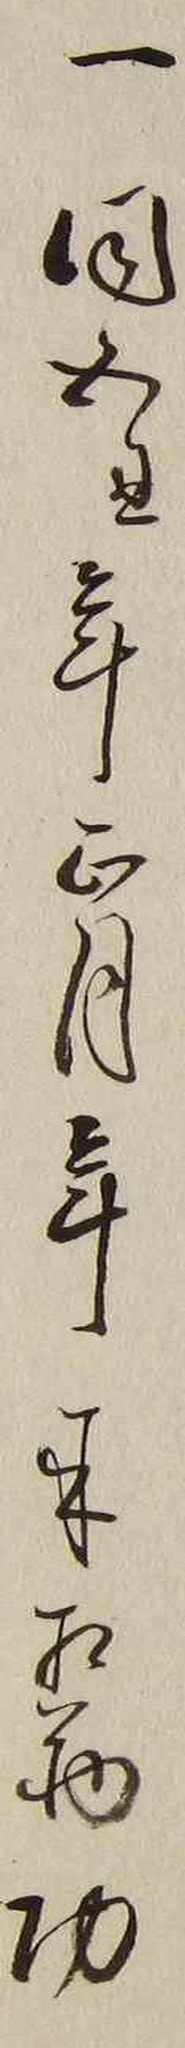一同五丑年正月年来相勤功
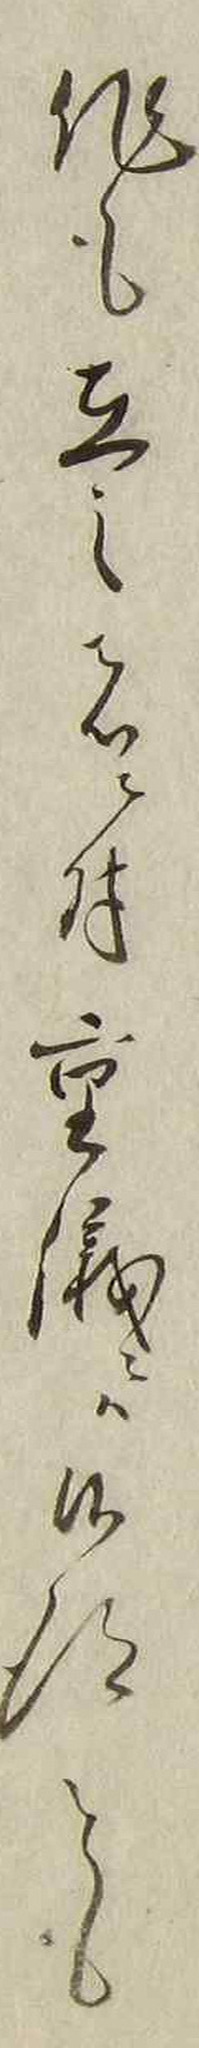作も在之者ニ付重儀ニハ候得とも
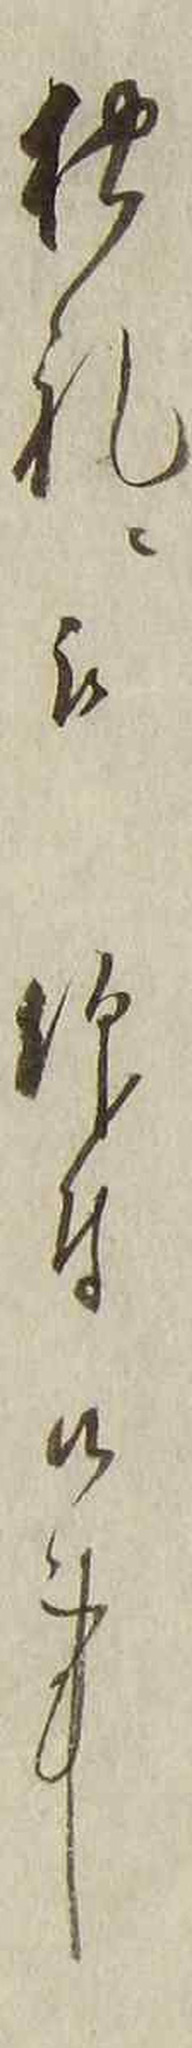独礼ニ被仰付候事

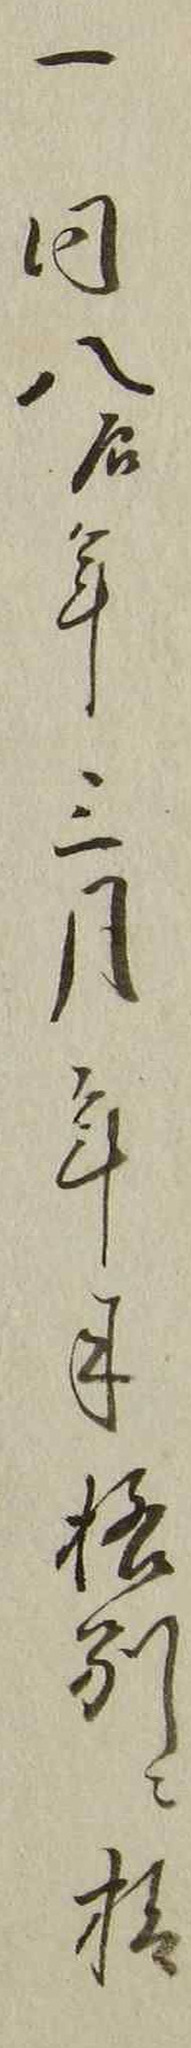一同八辰年三月年来格別ニ精
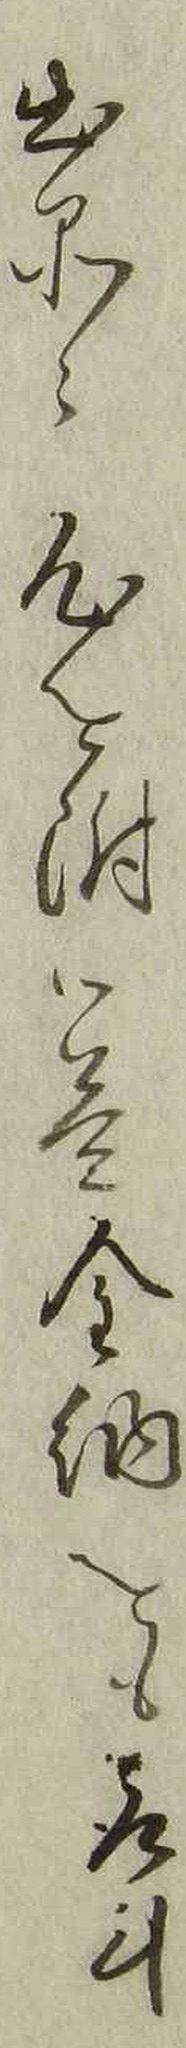出品々心を附御益金納をも取斗
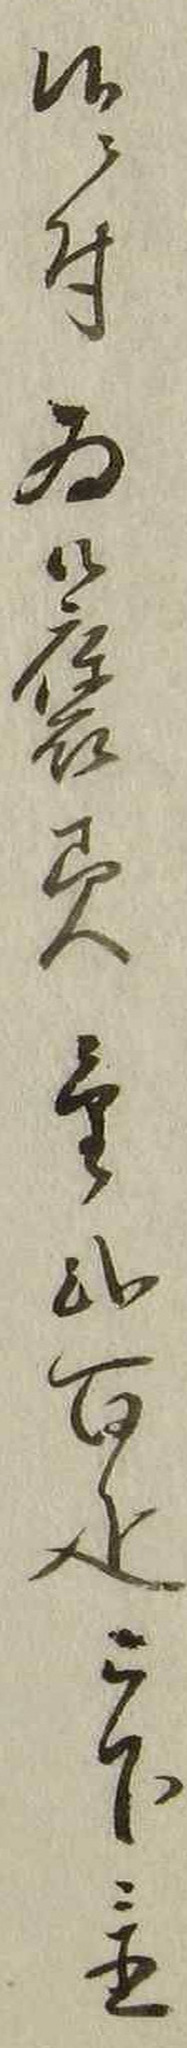候ニ付為御褒美金武百疋被下置
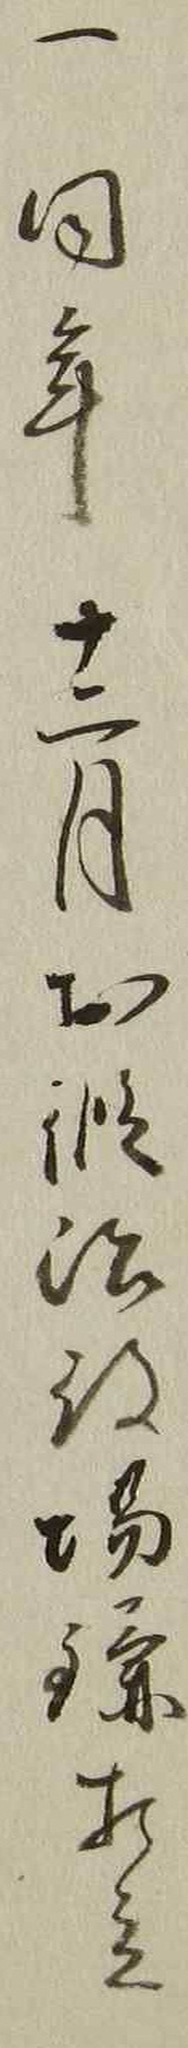一同年十二月於鍛治役場鎌打立
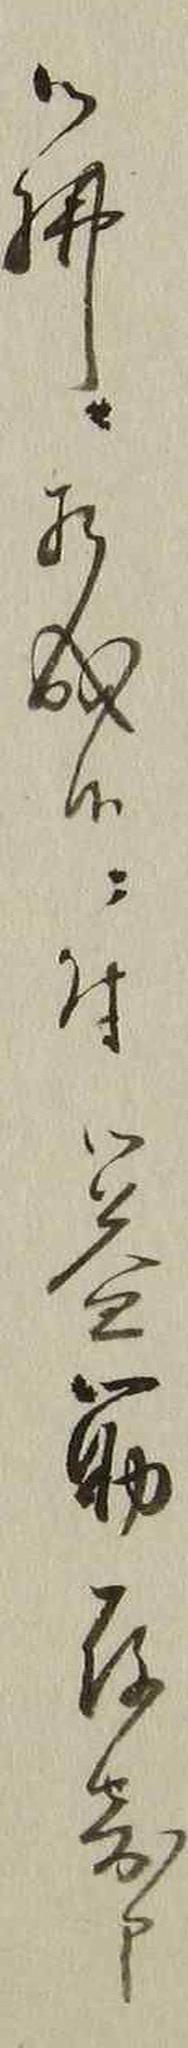御払ニ相成候ニ付御益筋存寄申
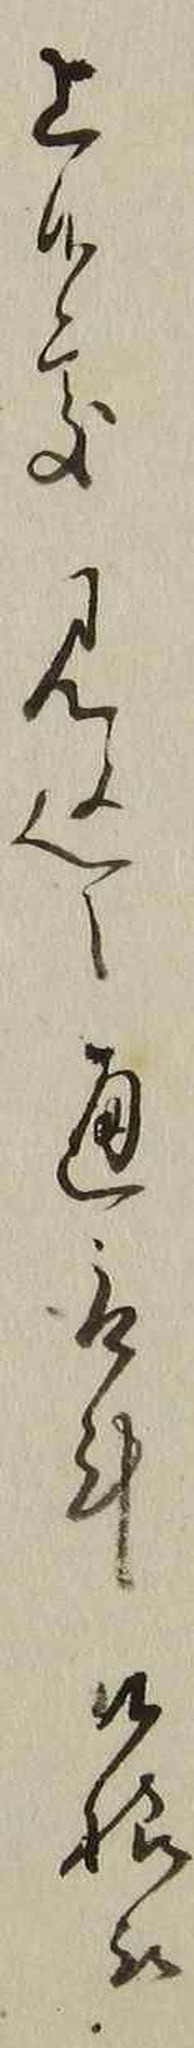上候処見込之通取計候様被
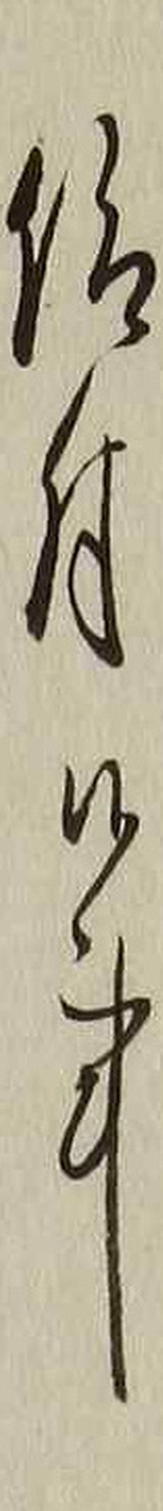仰付候事
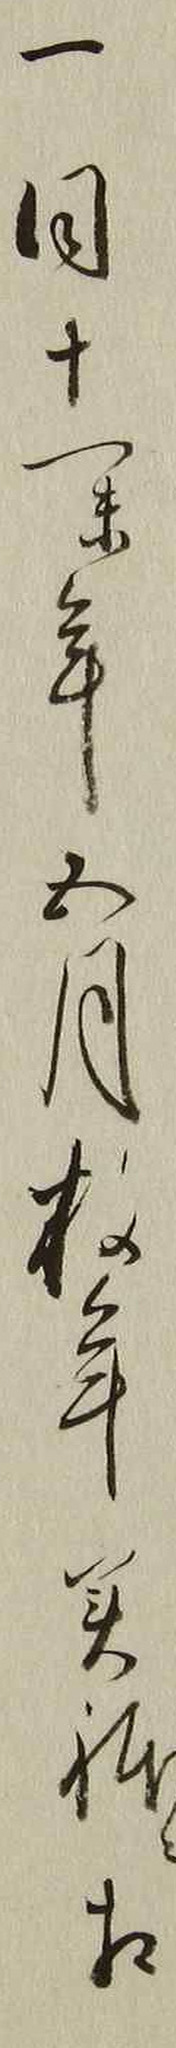一同十一未年五月数年実体ニ相
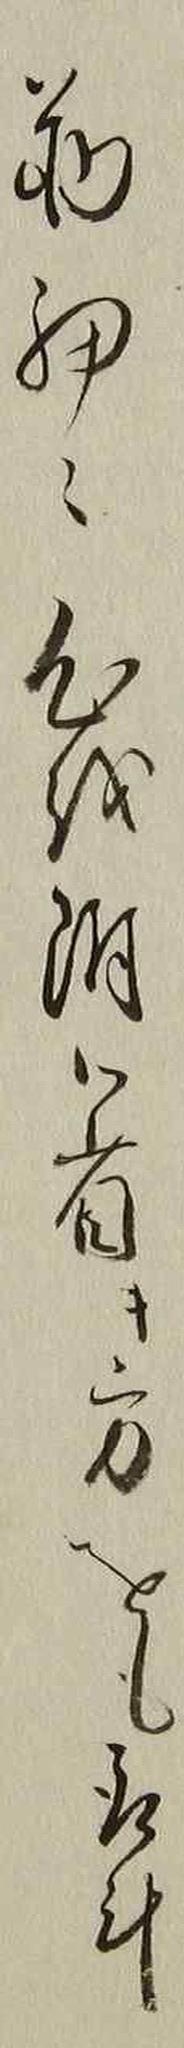勤細々心を附御省キ方をも取計
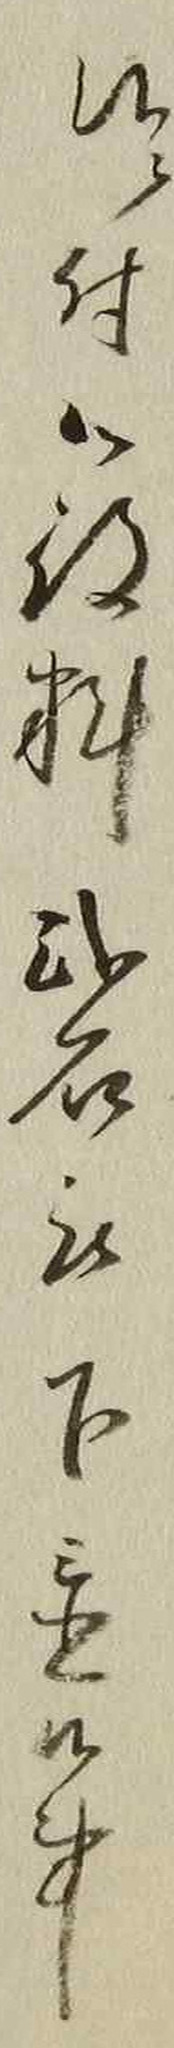候ニ付御役料弐石被下置候事
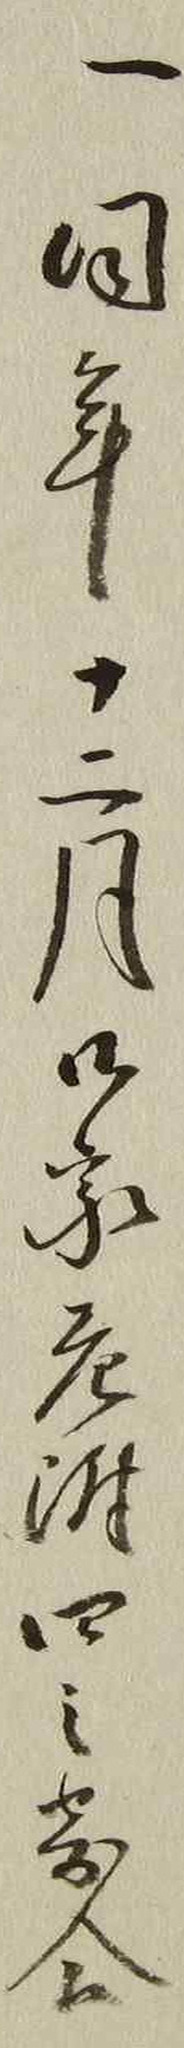一同年十二月御家老附四之寄合
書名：諸士系譜　巻之132　た之部8
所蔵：会津若松市立会津図書館
